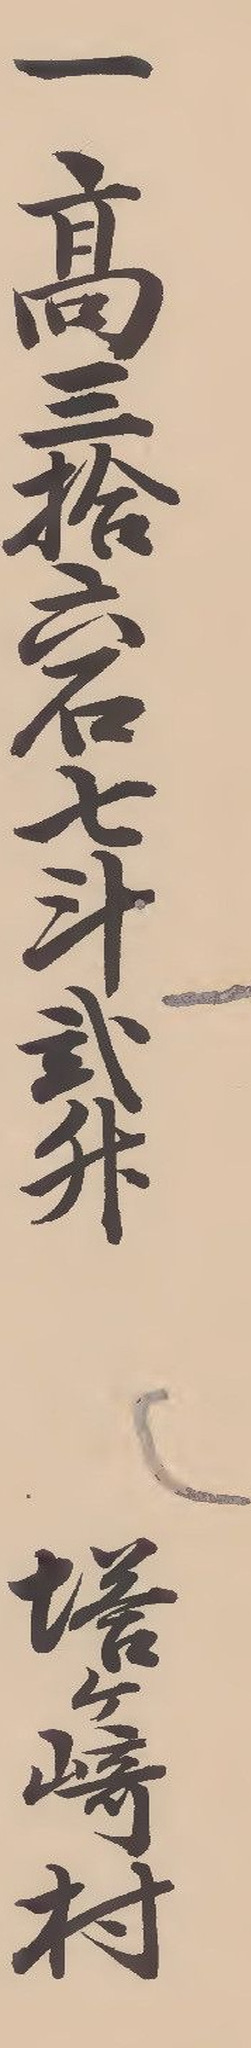一高三拾六石七斗弐升塔ヶ崎村
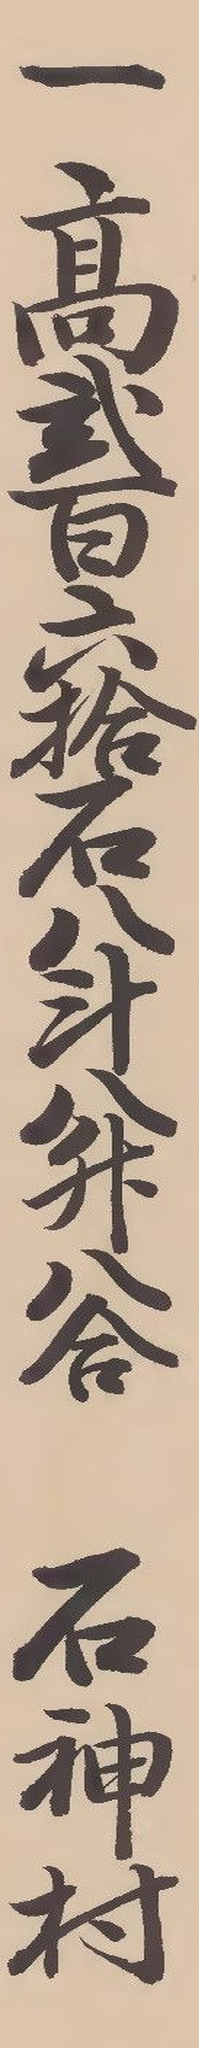一高弐百六拾石八斗八升八合石神村
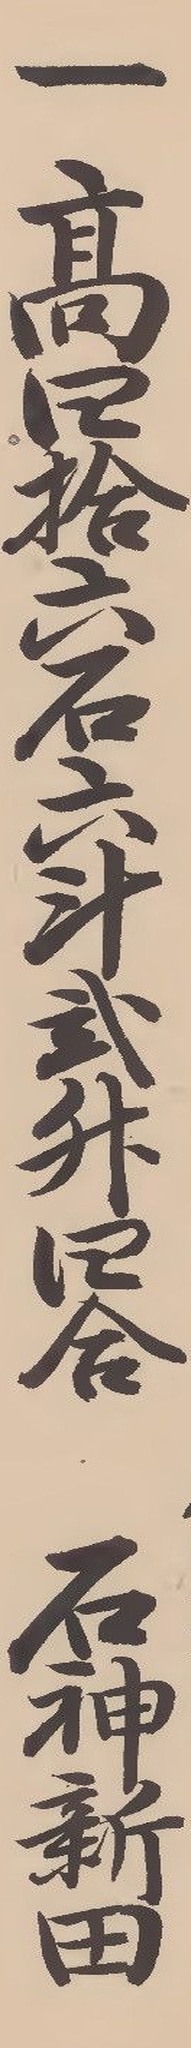一高四拾六石六斗弐升四合石神新田
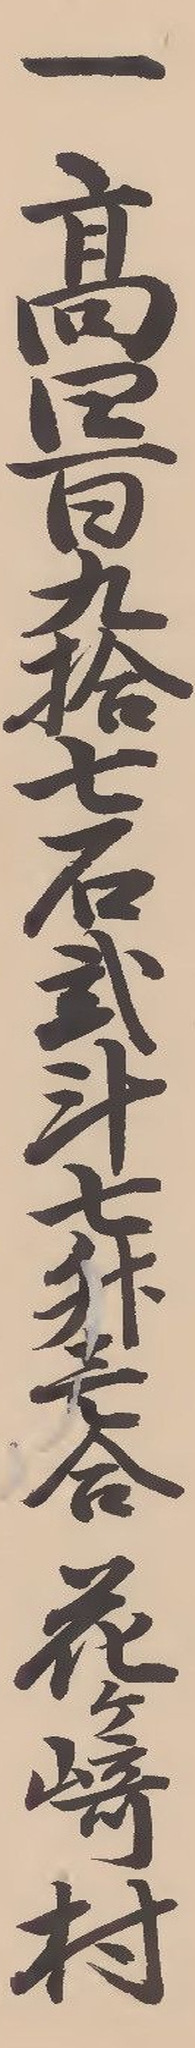一高四百九拾七石弐斗七升壱合花ヶ崎村
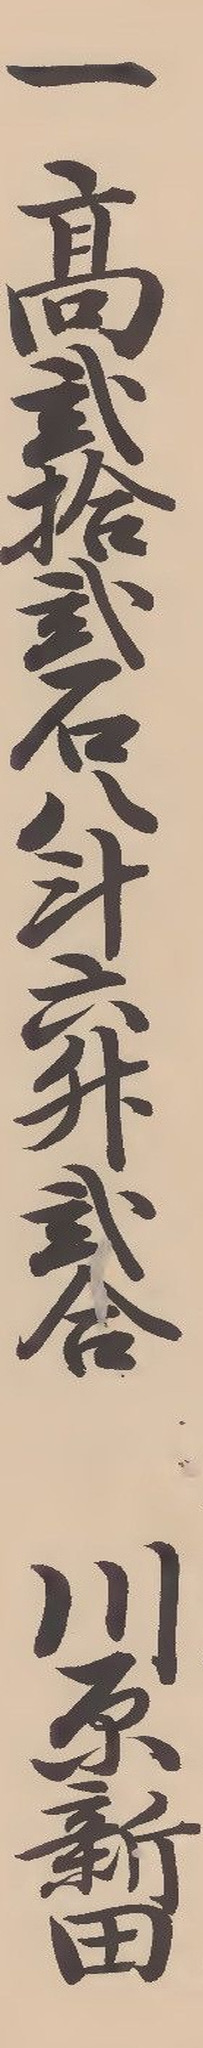一高弐拾弐石八斗六升弐合川原新田
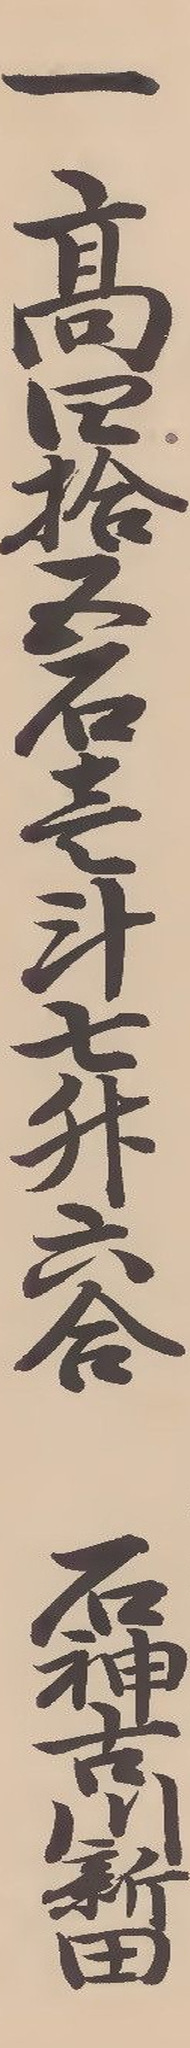一高四拾五石壱斗七升六合石神古川新田
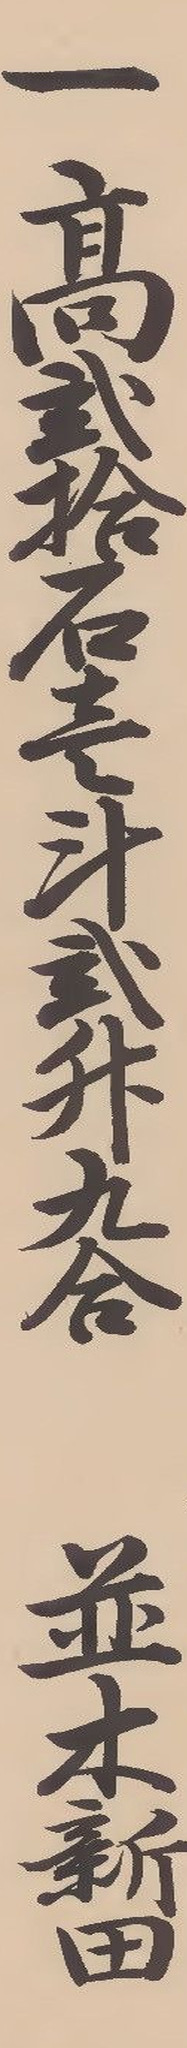一高弐拾石壱斗弐升九合並木新田
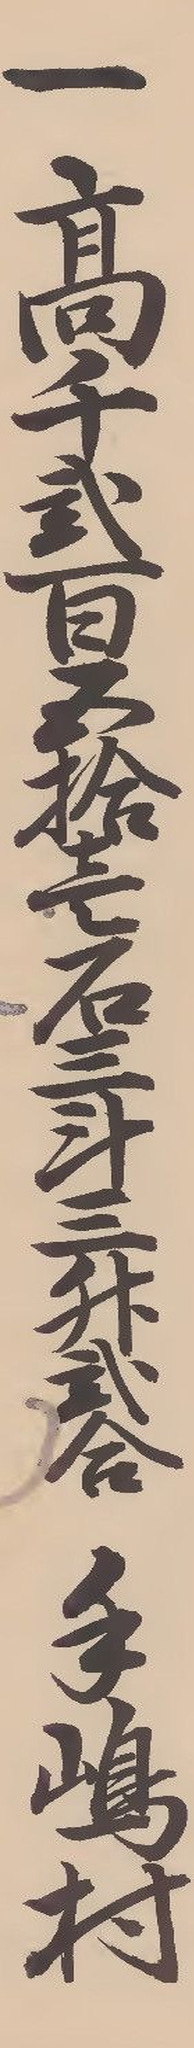一高千弐百五拾壱石三斗三升弐合手島村

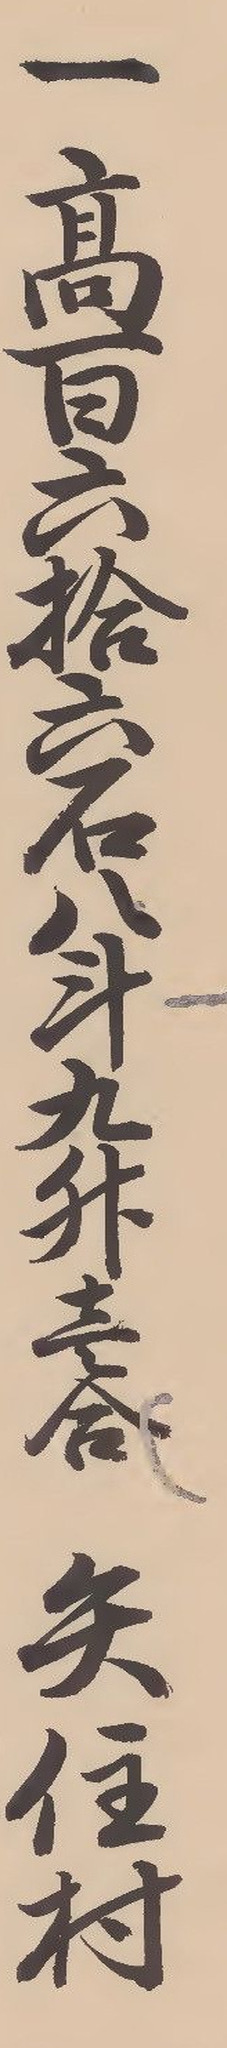一高百六拾六石八斗九升壱合矢住村
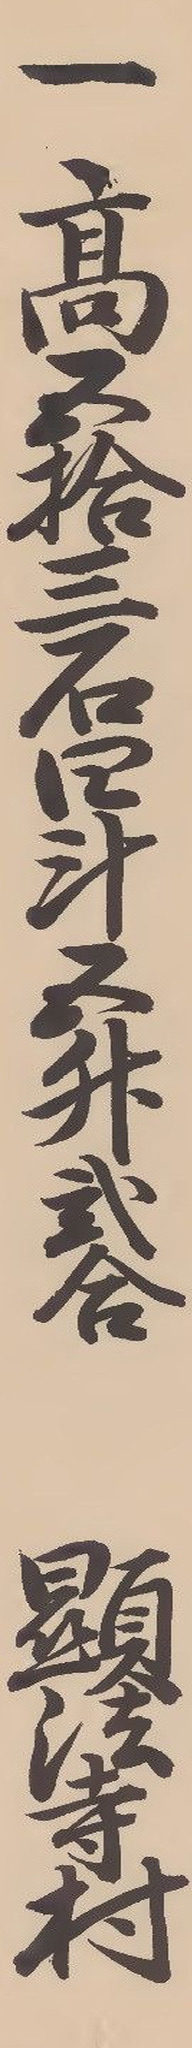一高五拾三石四斗五升弐合顕法寺村
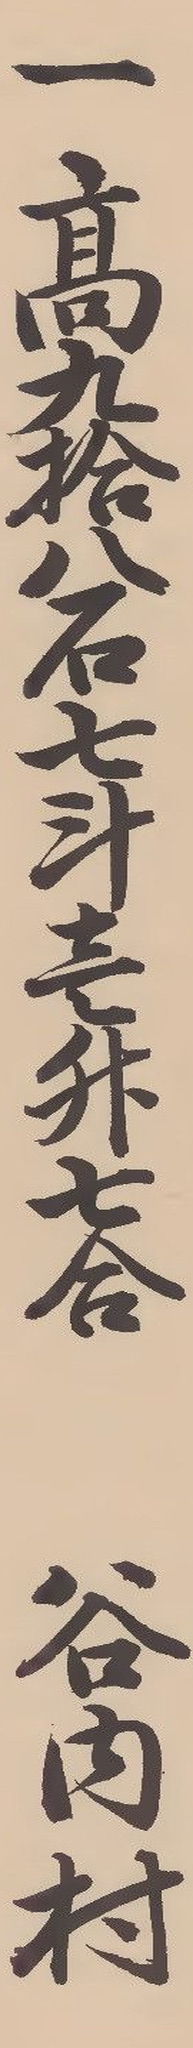一高九拾八石七斗壱升七合谷内村
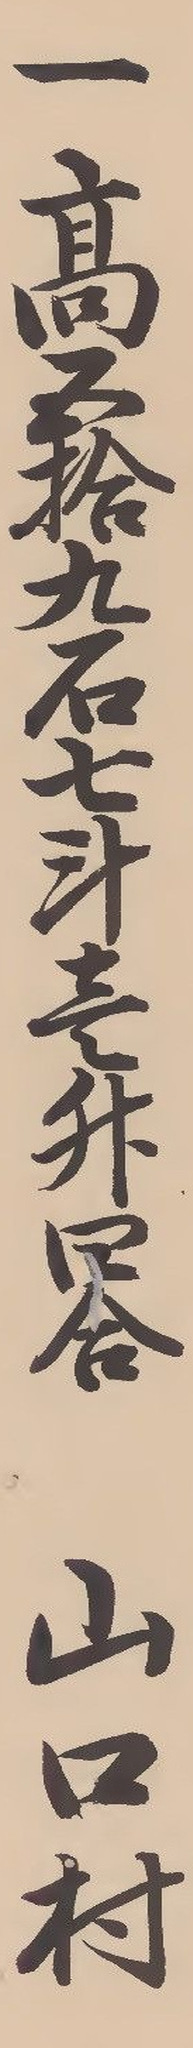一高五拾九石七斗壱升四合山口村
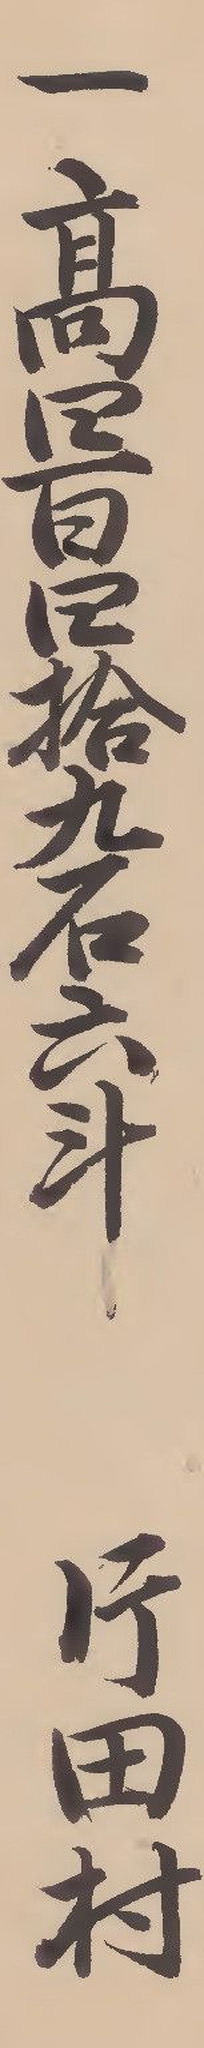一高四百四拾九石六斗片田村
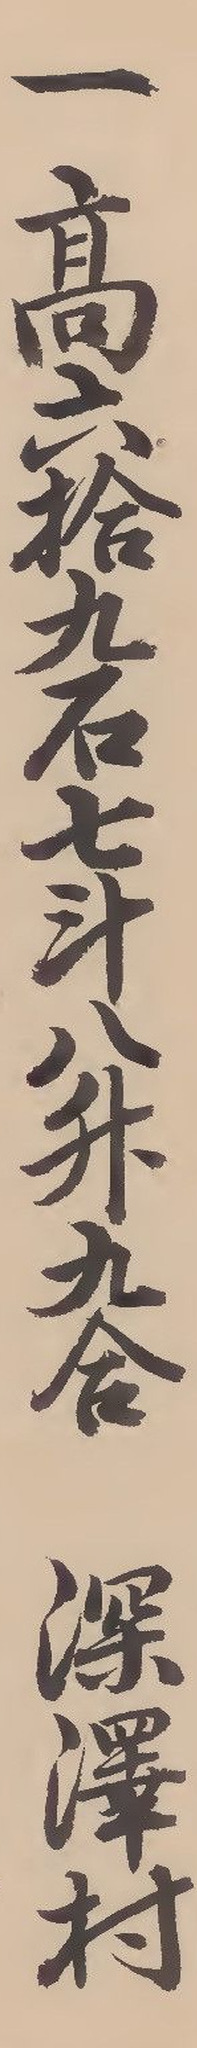一高六拾九石七斗八升九合深沢村
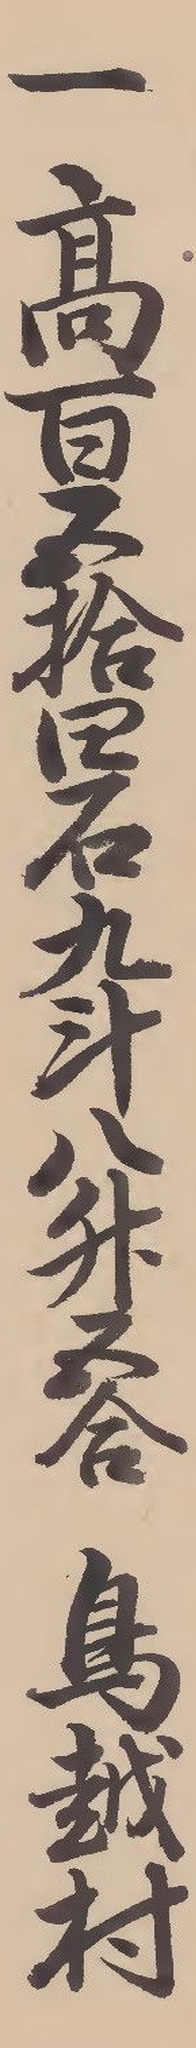一高百五拾四石九斗八升五合鳥越村
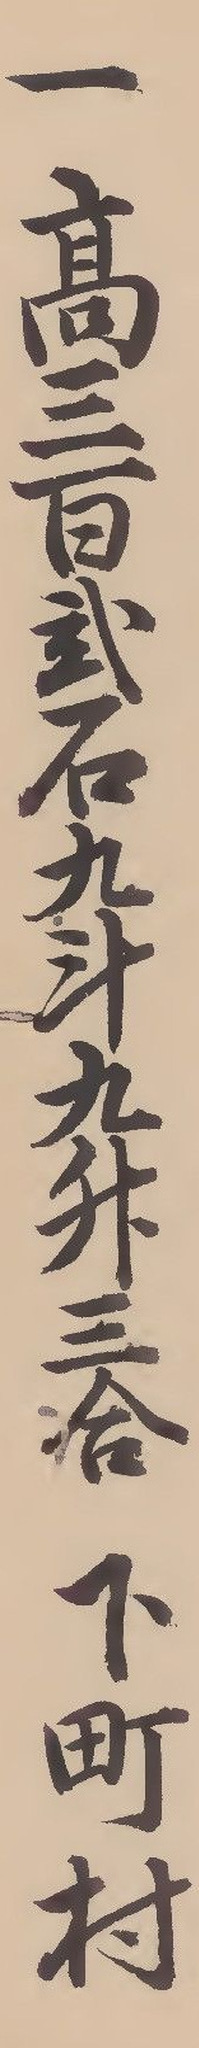一高三百弐石九斗九升三合下町村
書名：越後国郷帳　上
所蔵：国立公文書館 National Archives of Japan
